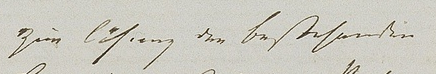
zur Lösung der bestehenden
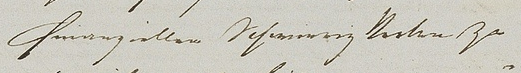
finanziellen Schwierigkeiten zu
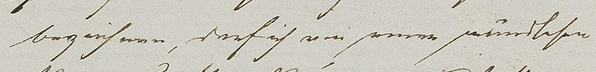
bezeichnen, darf ich von einer mündlichen
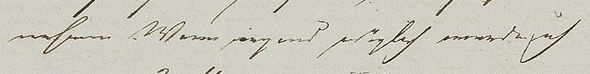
nehmen. Wenn irgend möglich werde ich
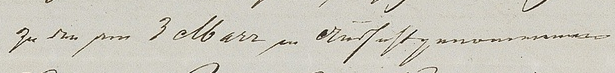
zu der am 3. März in Aussicht genommenen
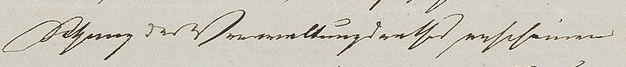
Sitzung des Verwaltungsrathes erscheinen
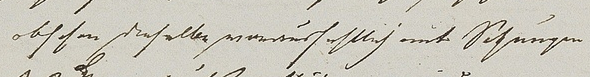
obschon dieselbe voraussichtlich mit Sitzungen
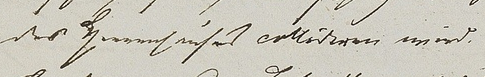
des Herrenhauses collidiren wird.
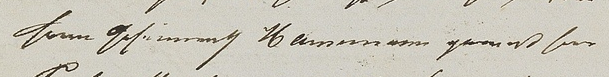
Herrn Geheimrath Hansemann gewiß Herr
